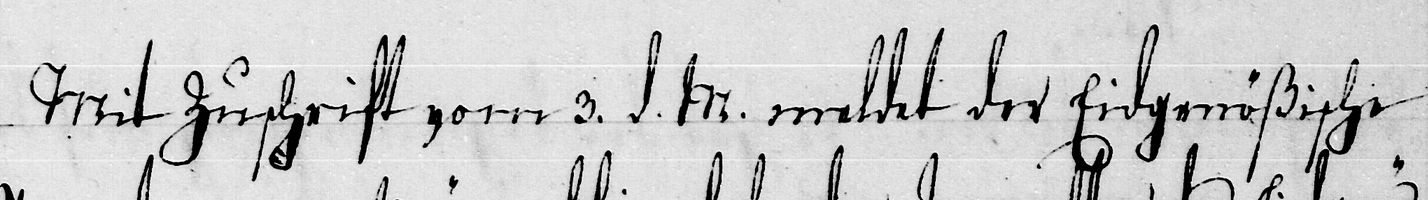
Mit Zuschrift vom 3. d. M. meldet der Eidgenößische
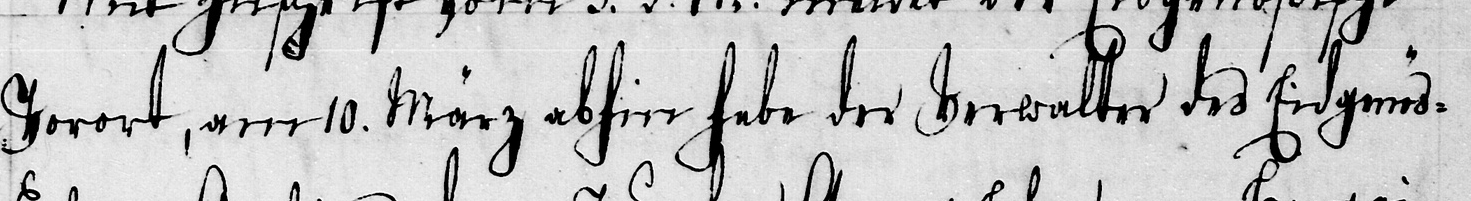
Vorort, am 10. März abhin habe der Verwalter des Eidgenöß¬
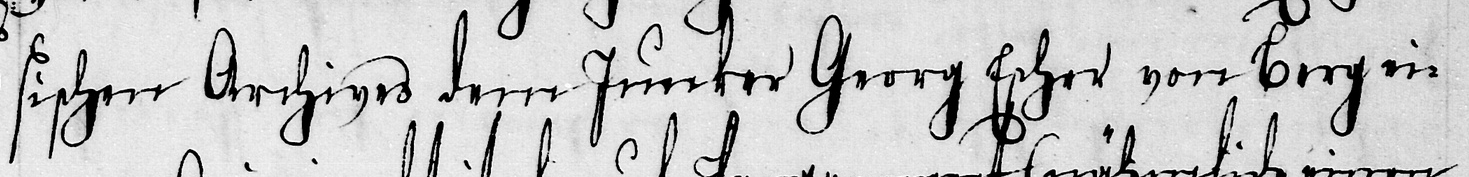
ischen Archives dem Junker Georg Escher von Berg ei¬
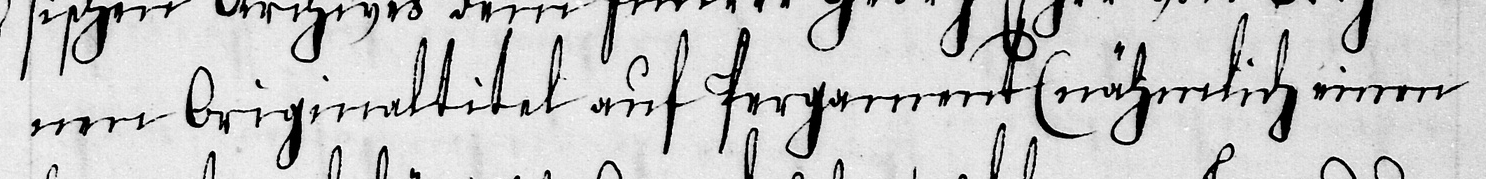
nen Originaltitel auf Pergament (nähmlich einen
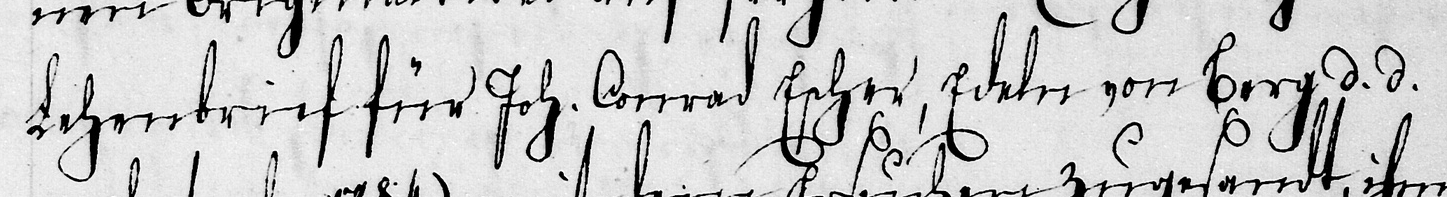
Lehenbrief für Joh. Conrad Escher von Berg d. d.
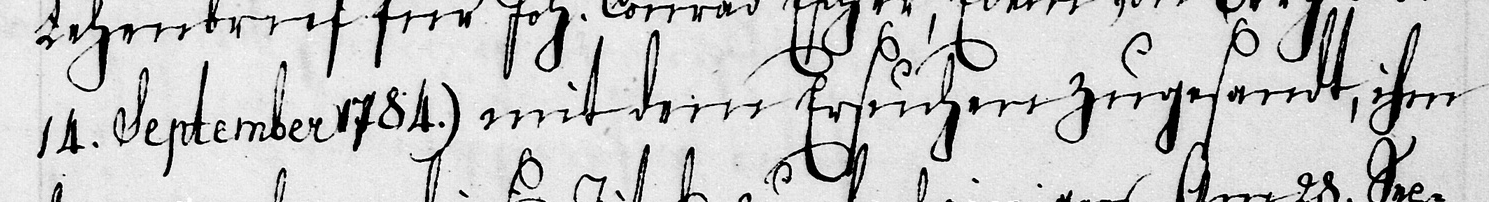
14. September 1784.) mit dem Ersuchen zugesandt, ihm
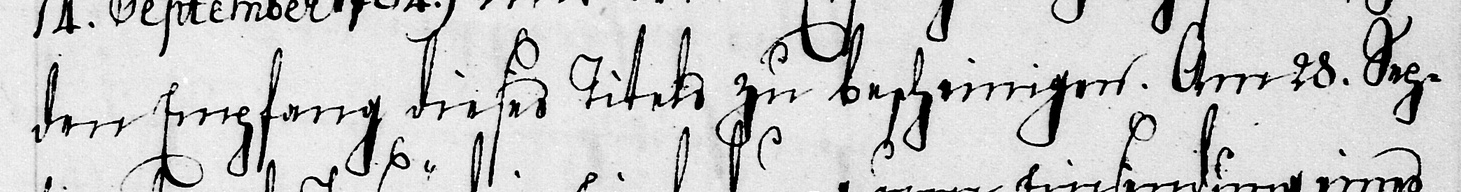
den Empfang dieses Titels zu bescheinigen. Am 28. Sep¬
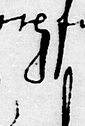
die
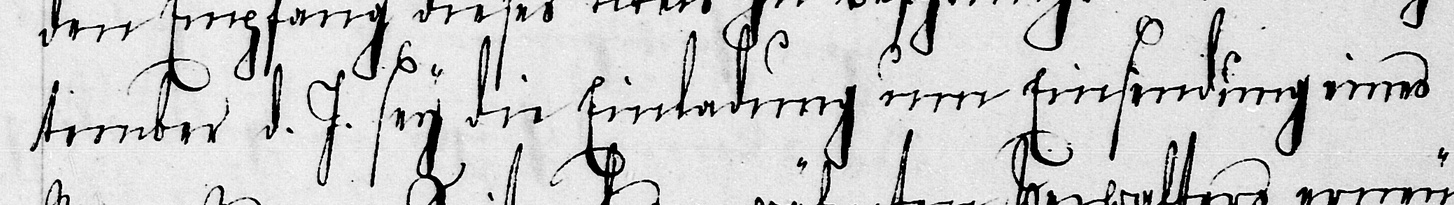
tember d. J. sey die Einladung um Einsendung eines
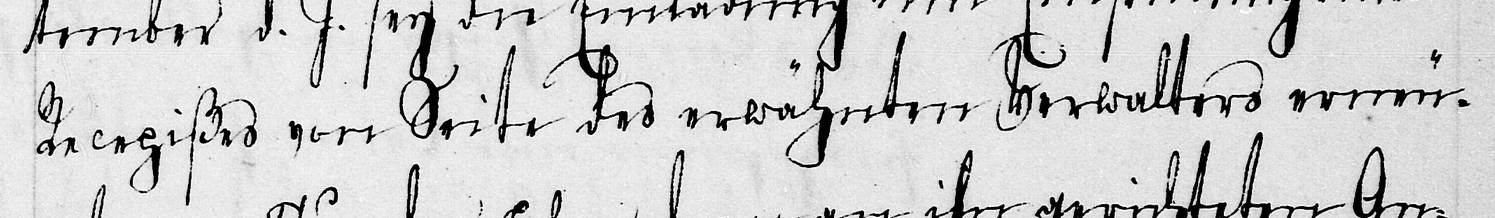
Recepißes von Seite des erwähnten Verwalters erneu¬
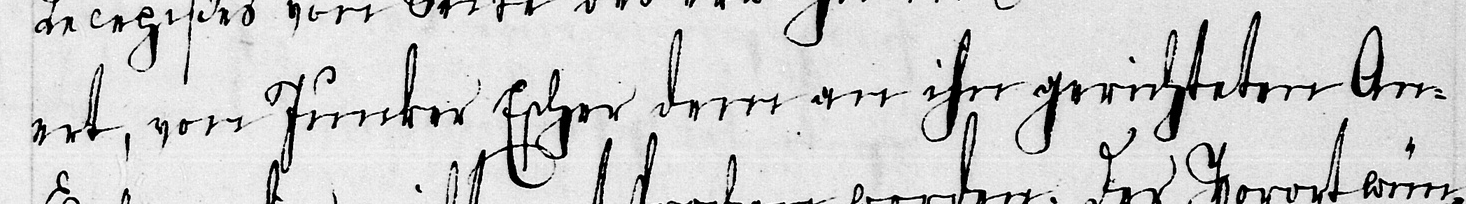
ert, von Junker Escher dem an ihn gerichteten An¬
